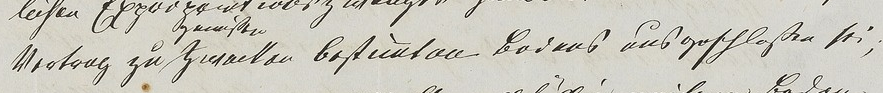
Vertrag zu gewissen Zwecken bestimmten Bodens ausgeschloßen sei;
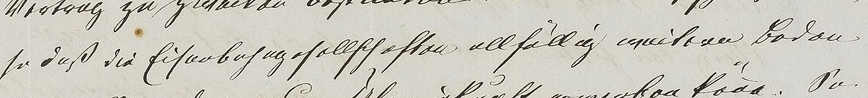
so daß die Eisenbahngesellschaften allfällig weitern Boden
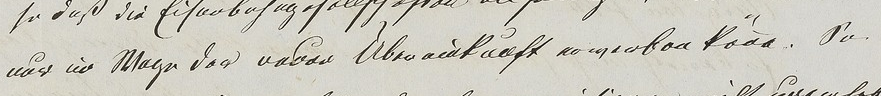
nur im Wege der neuen Übereinkunft erwerben könne. So
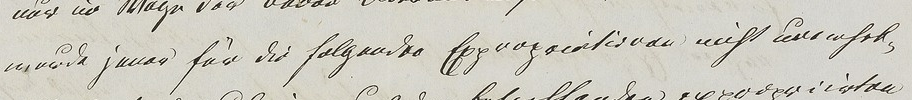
wurde jener für die folgenden Expropriationen nicht unerheb-
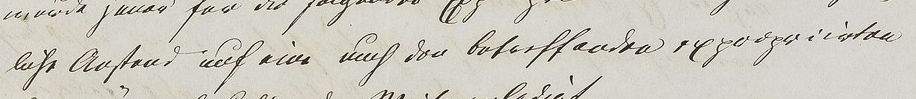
liche Anstand auf eine auch den betreffenden expropriirten
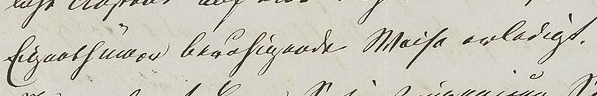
Eigenthümer beruhigende Weise erledigt.
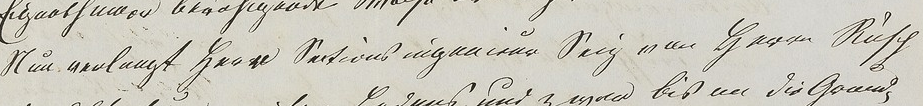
Nun verlangt Herr Sectionsingenieur Seiz von Herrn Rüsch
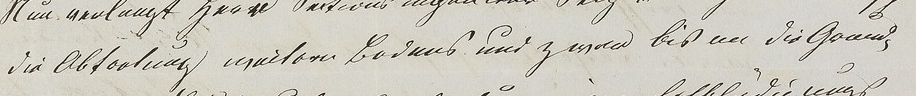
die Abtretung weitern Bodens und zwar bis an die Grund-
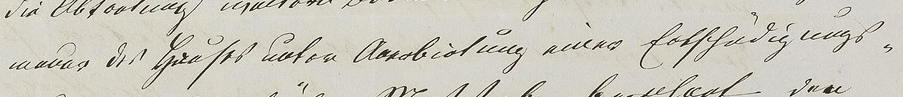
mauer des Hauses unter Anerbietung einer Entschädigungs-
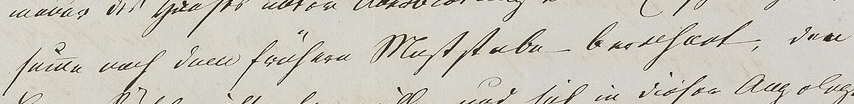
summe nach dem frühern Maßstabe berechnet, den
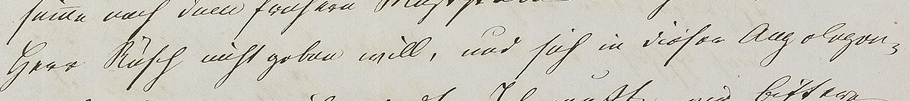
Herr Rüsch nicht geben will, und sich in dieser Angelegen-
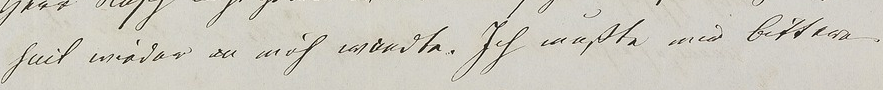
heit wieder an mich wandte. Ich mußte mir bittere
